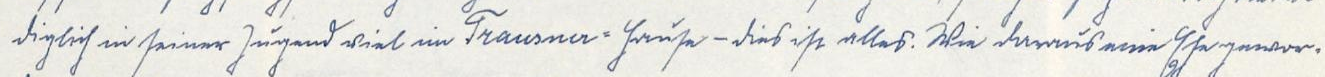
diglich in seiner Jugend viel im Trausner-Hause - dies ist alles. Wie daraus eine Ehe gewor-
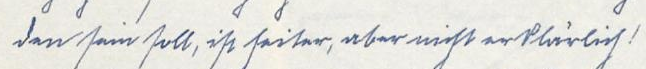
den sein soll ist heiter, aber nicht erklärlich!
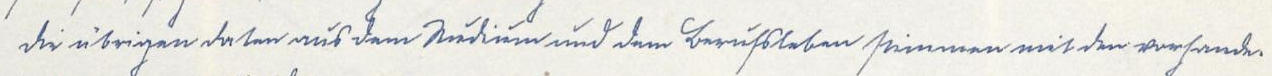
Die übrigen Daten aus den Studium und dem Berufsleben stimmen mit den vorhande-
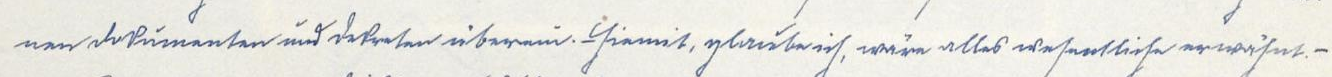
nen Dokumenten und Dekreten überein. Hiemit, glaube ich, werde alles wesentliche erwähnt.-
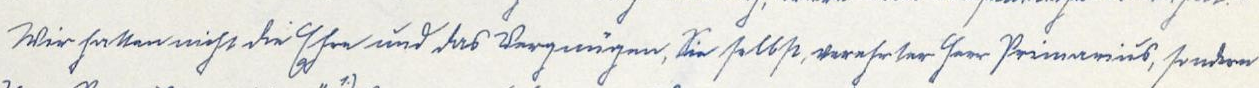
Wir hatten nicht die Ehre und das Vergnügen, Sie selbst, verehrter Herr Primarius, sondern
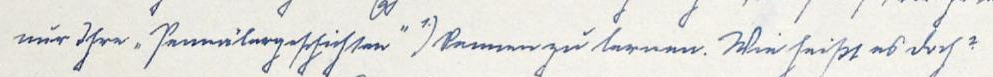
nur Ihre „Pennälergeschichten“ 1) kennen zu lernen. Wie heißt es doch?
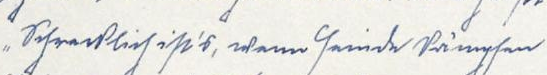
„Schrecklich ist’s, wenn Feinde kämpfen
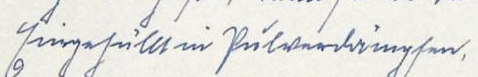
Eingehüllt in Pulverdämpfen,
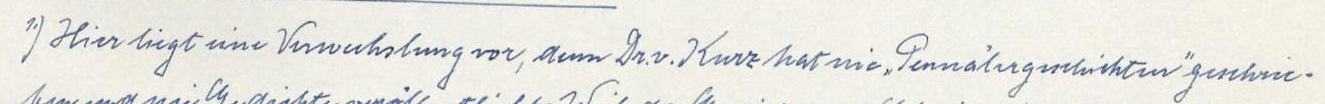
1) Hier liegt eine Verwechslung vor, denn Dr. v. Kurz hat nie „Pennälergeschichten“ geschrie-
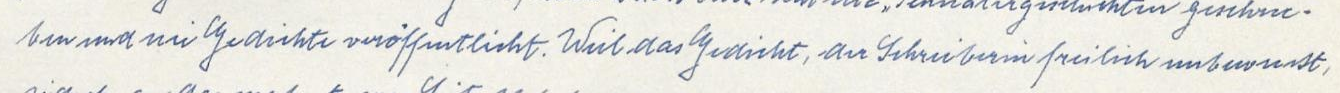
ben und nie Gedichte veröffentlicht. Weil das Gedicht, der Schreiberin freilich unbewusst,
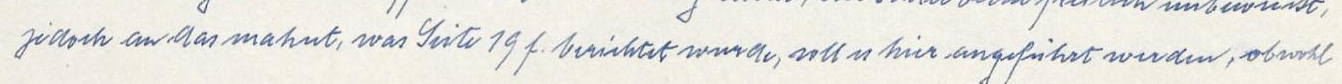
jedoch an das mahnt, was Seite 19 f. berichtet wurde, soll es hier angeführt werden, obwohl
